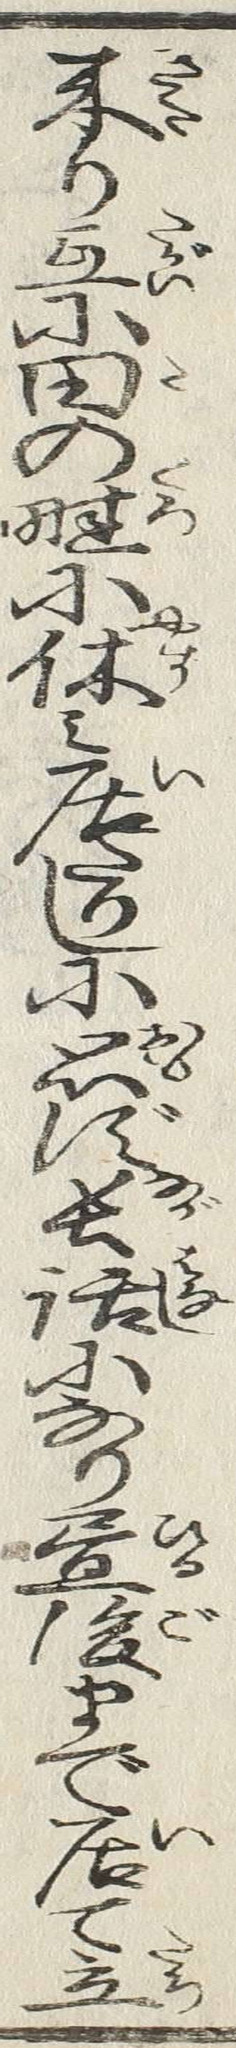来り互に田の畦に休み居たりしに思ず長話になり昼後まで居て立
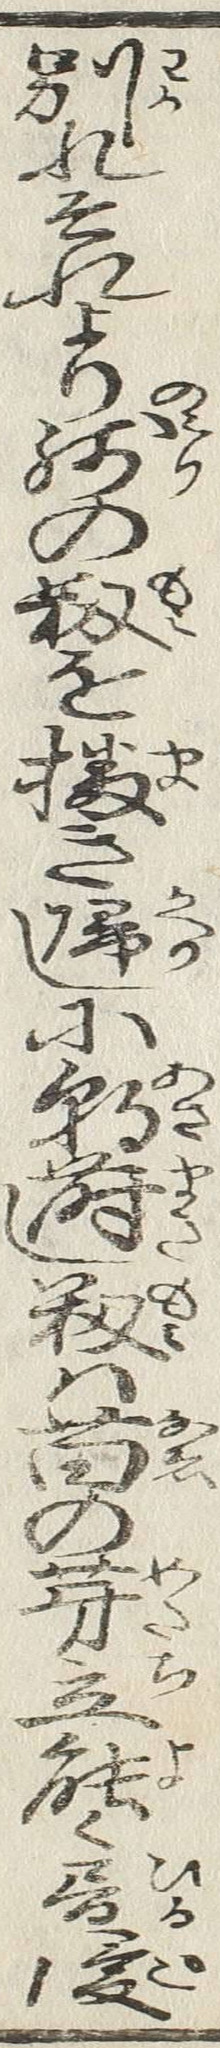別れそれより残の籾を播き帰しに朝蒔し籾は苗の芽立能く昼後
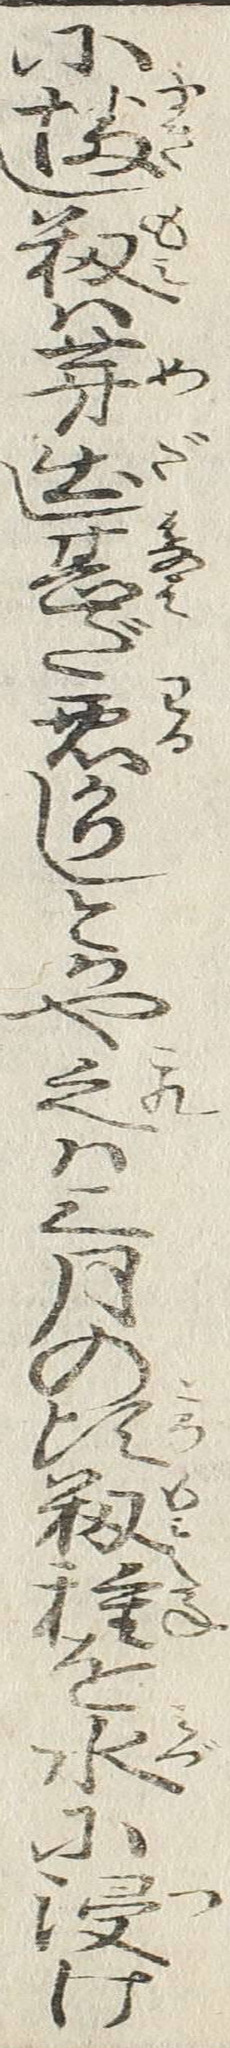に播し籾は芽出し甚だ悪かりしとかや之は三月の頃籾種を水に浸け
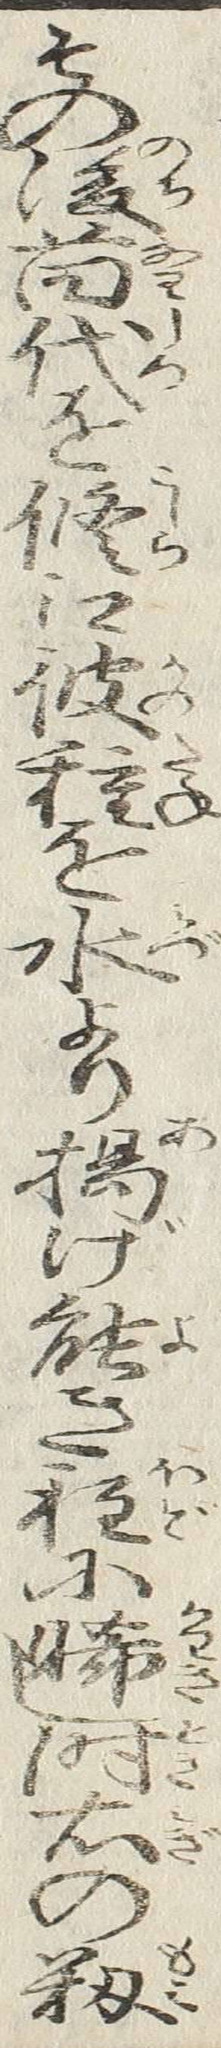その後苗代を修え彼種を水より揚げ能き程に晞し时右の籾
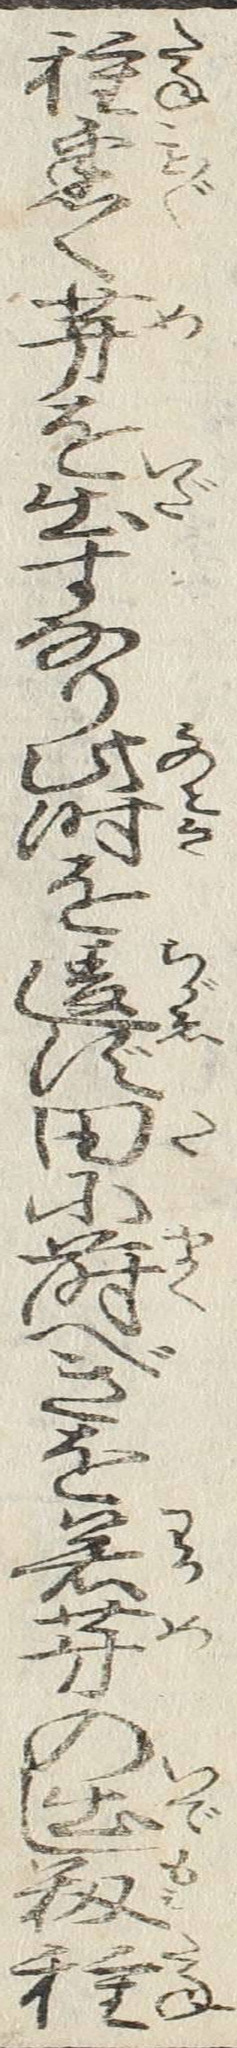種悉く芽を出すなり此时を違ず田に蒔べきを若芽の出し籾種
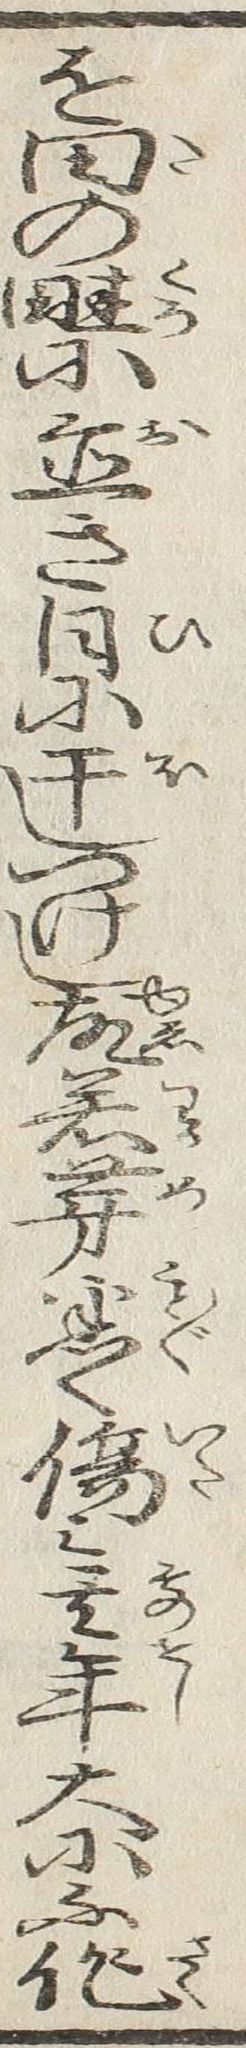を田の畦に置き日に干しつけし故若芽悉く傷み其年大にふ作

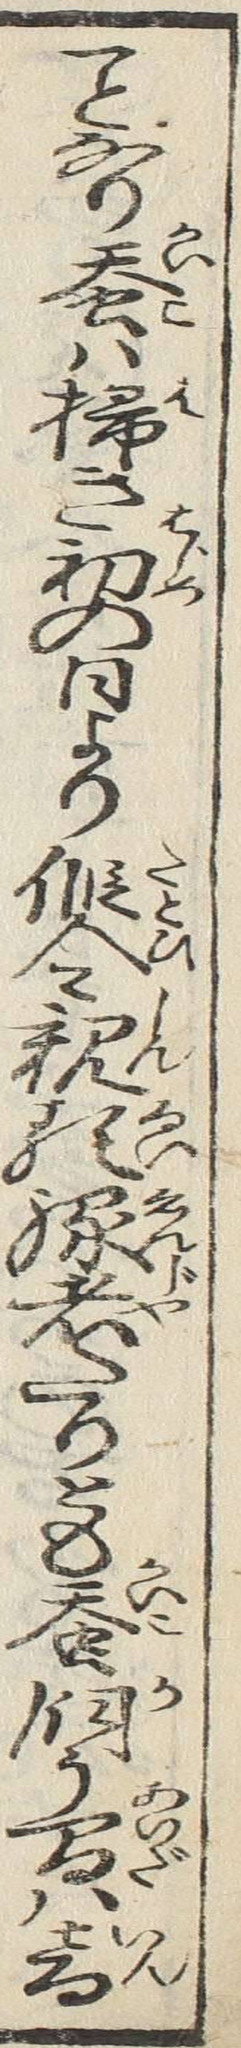ことなり蚕は掃き初の日より假令親類縁者たりとも蚕飼う間は音
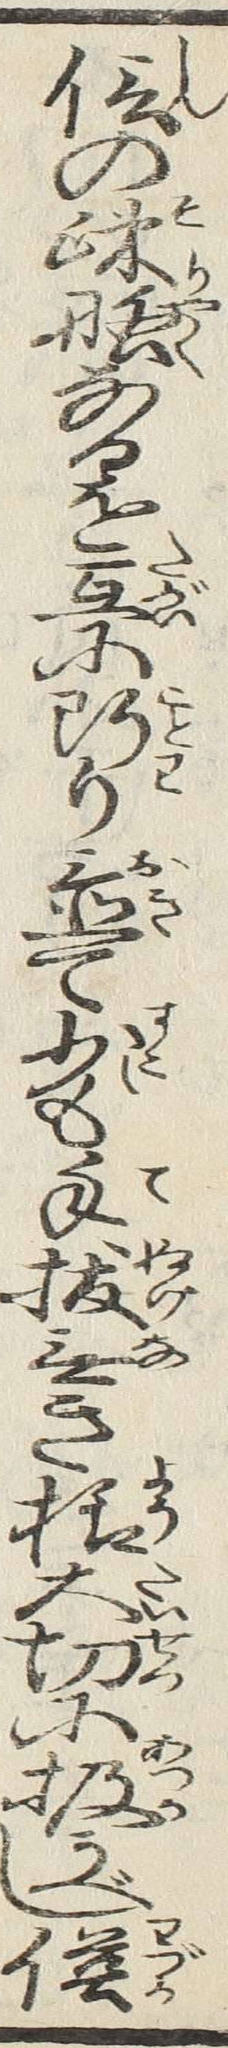信の疎略なるを互に断り置て少も手抜無き様大切に扱うべし僅
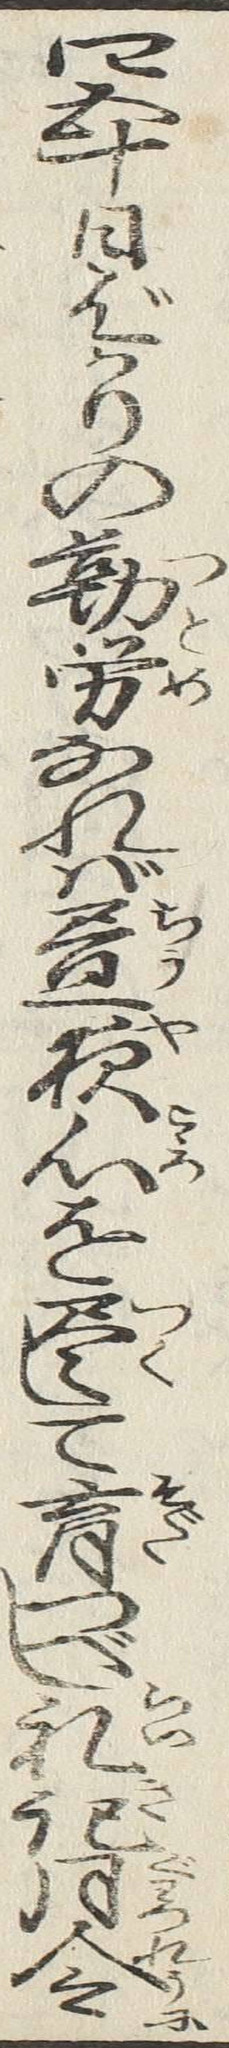四五十日ばかりの勤労なれば昼夜心を尽して育つべし礼記月令
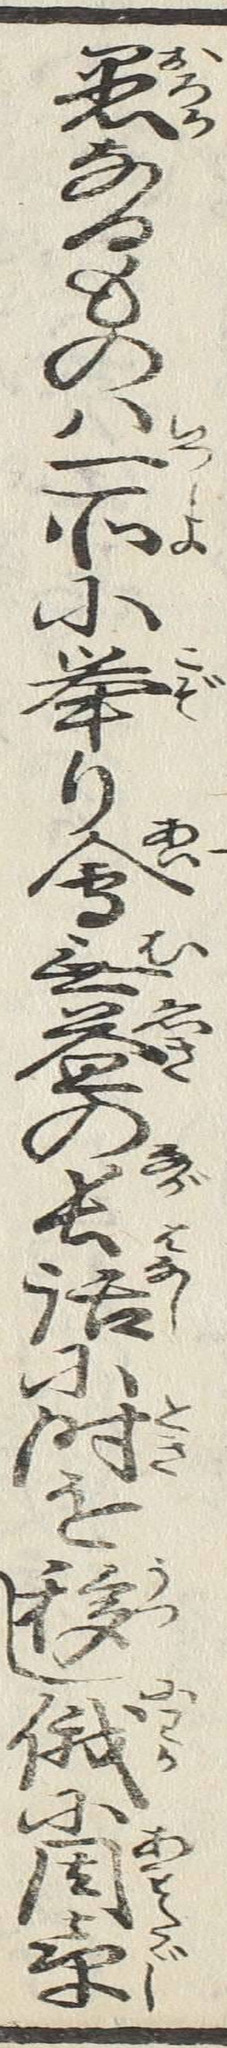愚なるものは一所に举り會無益の長話に时を移し俄に周章
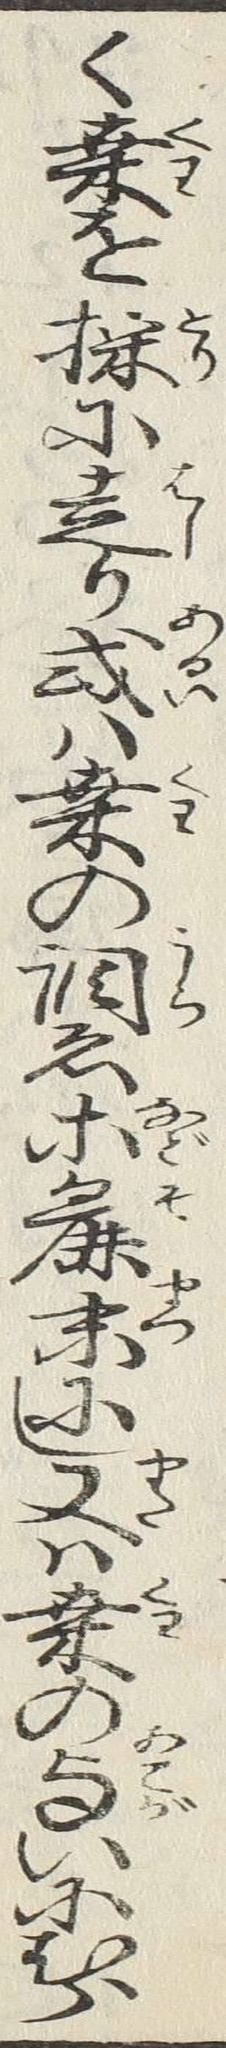く桒を採に走り或は桒の調ゑ等麁末にし又は桒の与いにむら
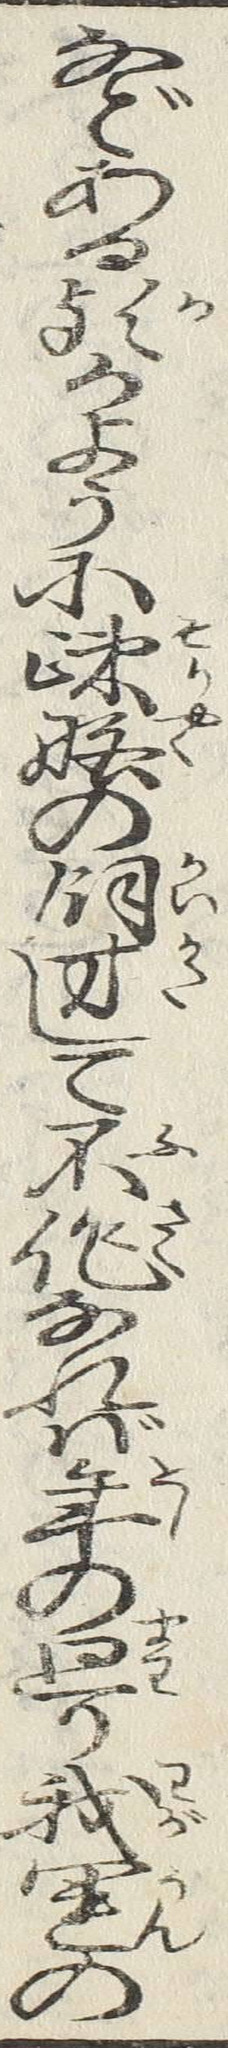などある欤かように疎略の飼方して不作なれば年の廻り我運の
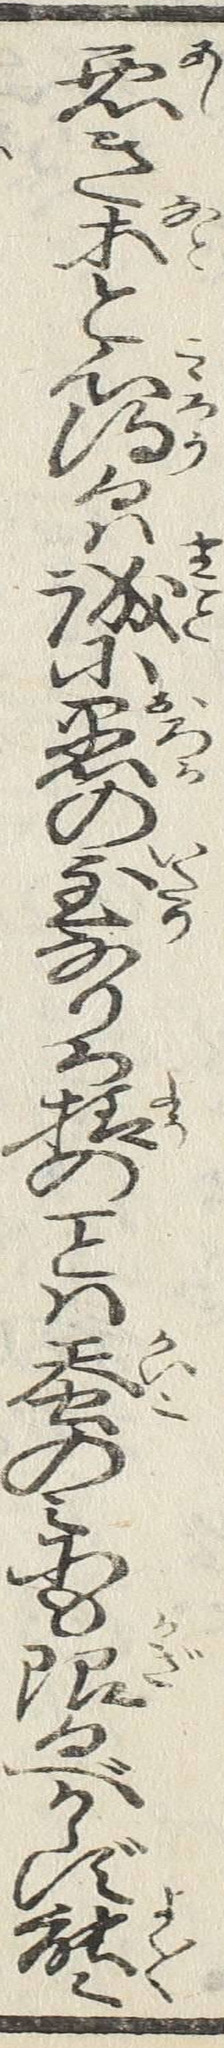悪き等と心得るは誠に愚の至なりか様のことは蚕のみにも限るべからず能々
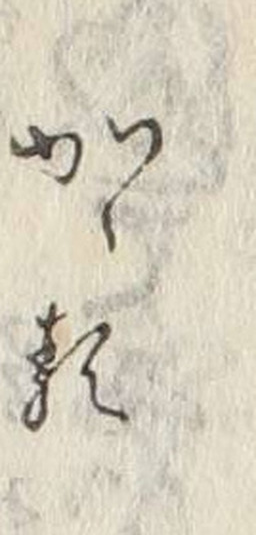かゝる
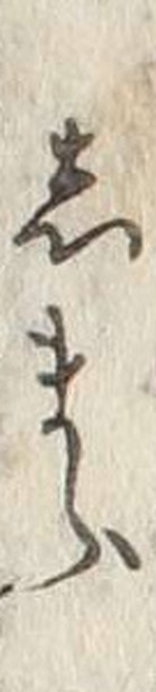しまふ

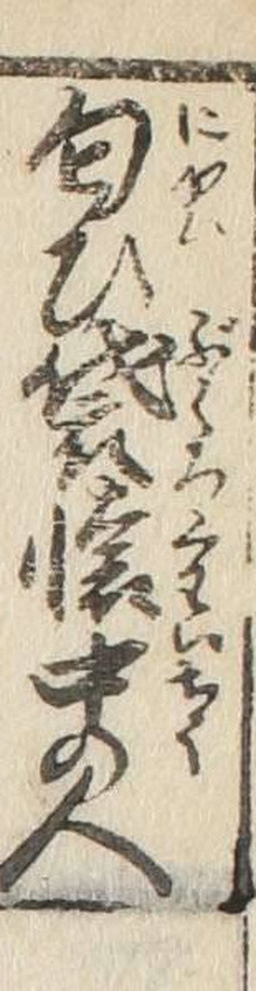匂袋懐中の人
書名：養蠶實驗録
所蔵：東京大学農学生命科学図書館 国文学研究資料館
